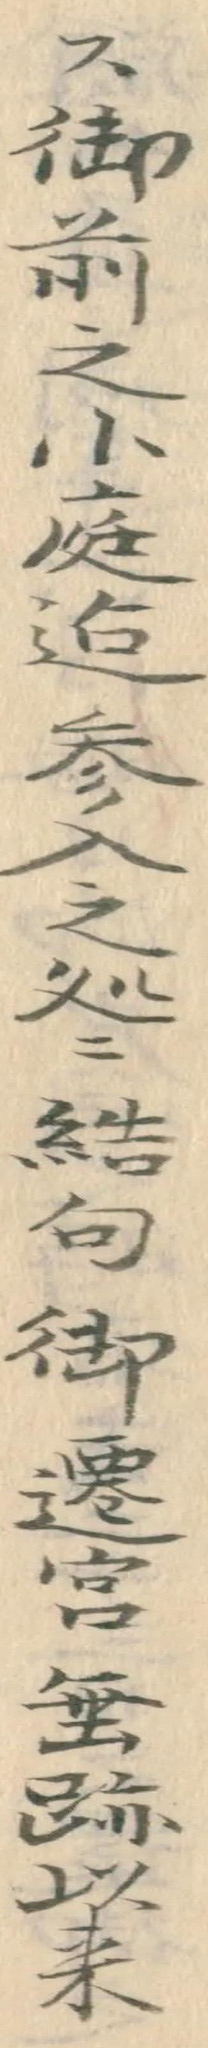ス御前之小庭迄参入之処ニ結句御遷宮垂跡以来
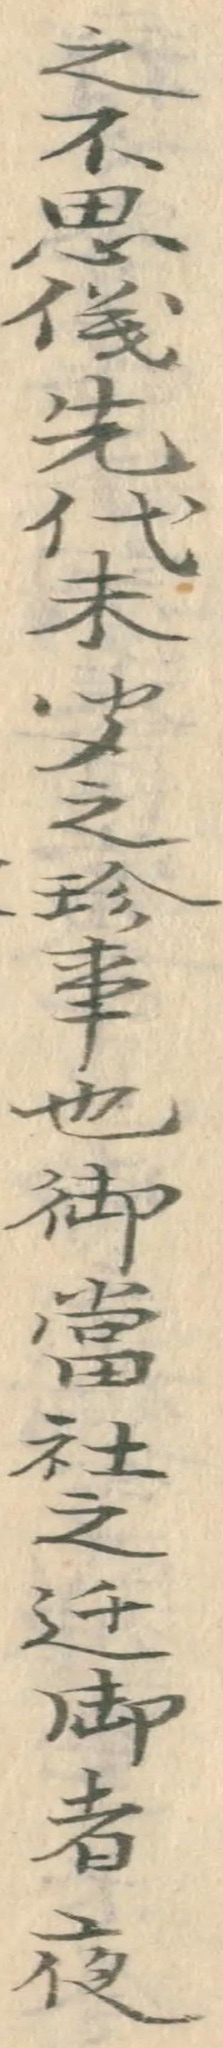之不思儀先代未聞之珍事也御当社之遷御者夜
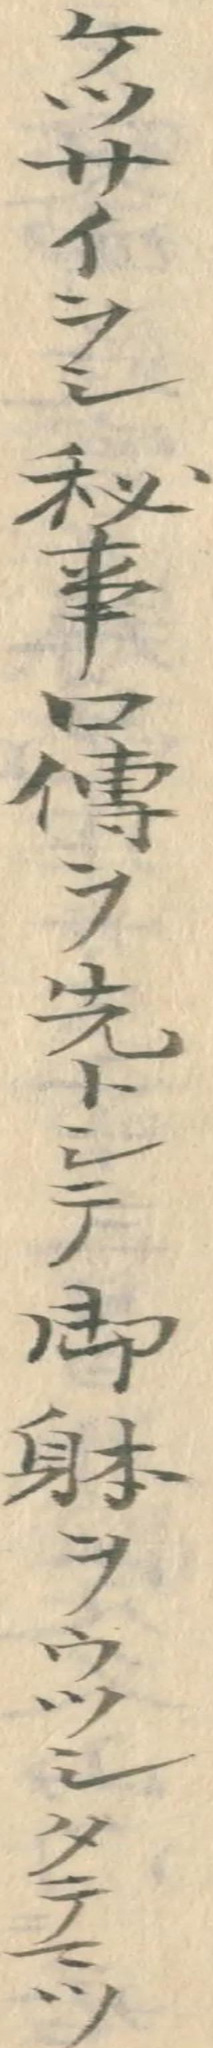ケツサイヲシ秘事口伝ヲ先トシテ御体ヲウツシタテマツ
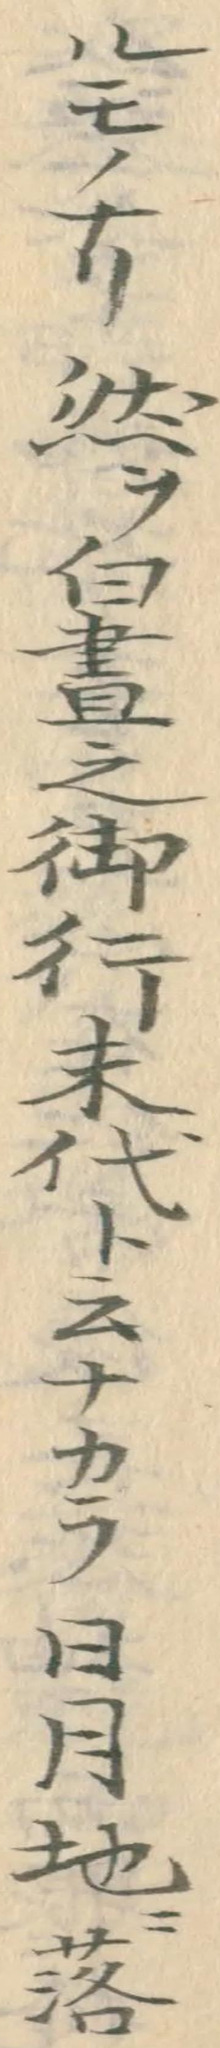ルモノナリ然ヲ白昼之御行末代ト云ナカラ日月地ニ落

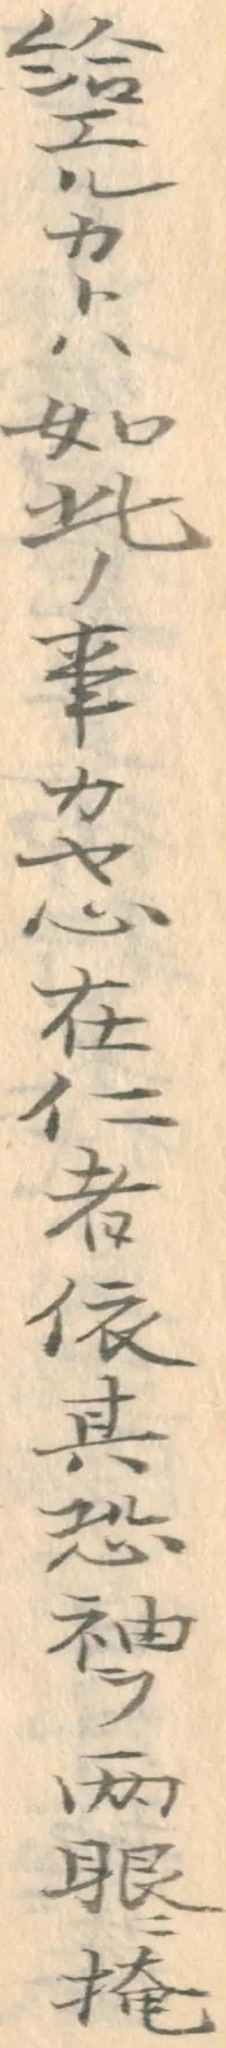給エルカトハ如此ノ事カヤ心在仁者依其恐袖ヲ両眼ニ掩
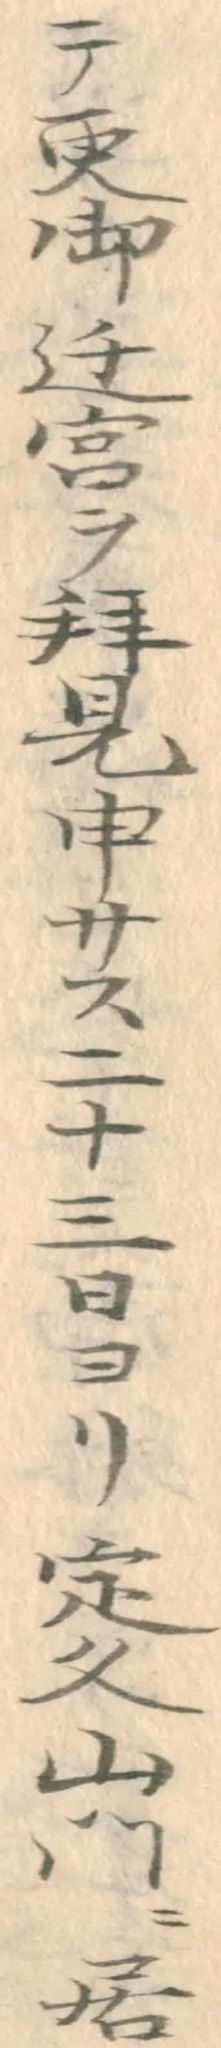テ更御遷宮ヲ拝見申サス二十三日ヨリ定久山門ニ居
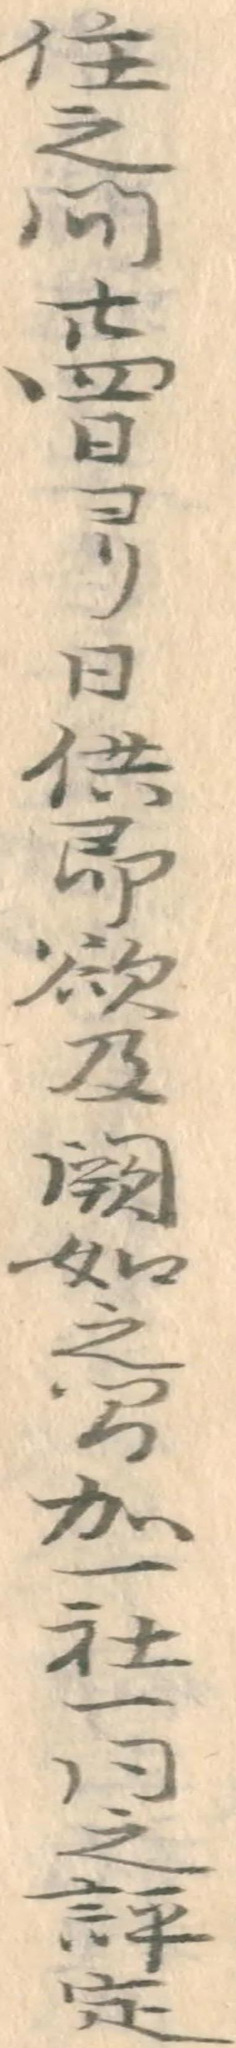住之間廿四日ヨリ日供即欲及闕如之間加一社一同之評定
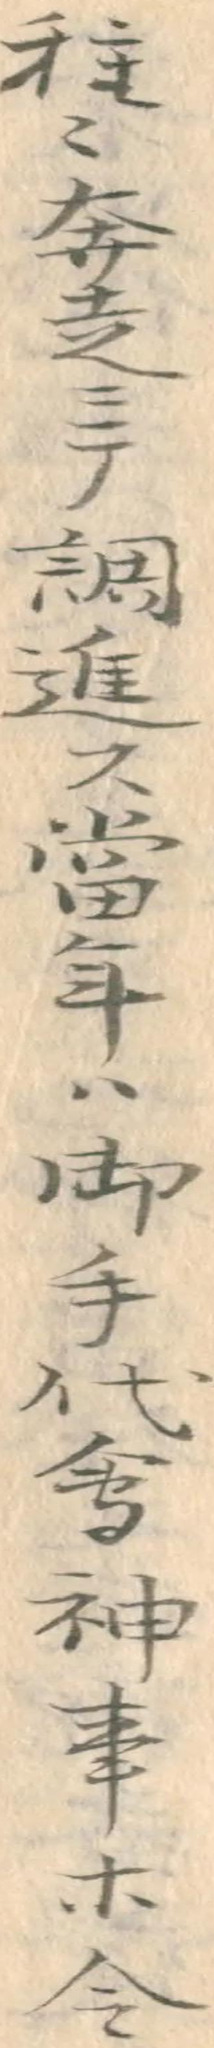種々奔走ニテ調進ス当年ハ御手代会神事等令
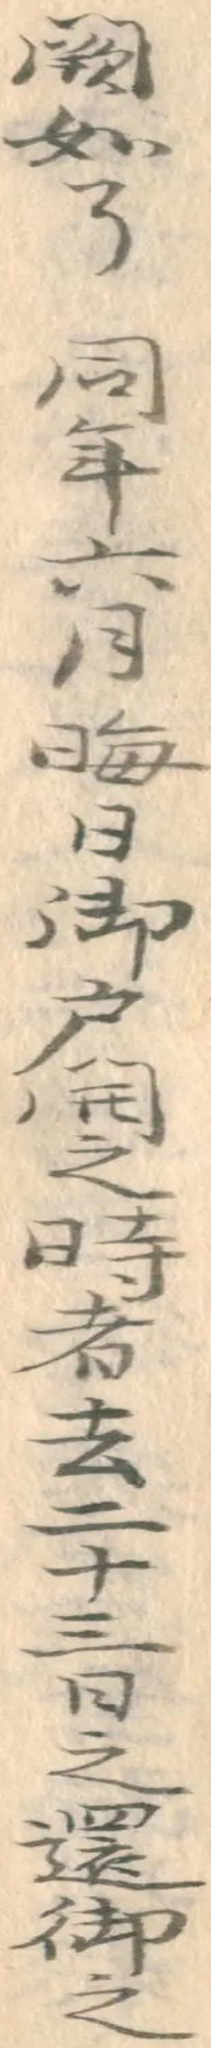闕如了同年六月晦日御戸開之時者去二十三日之還御之
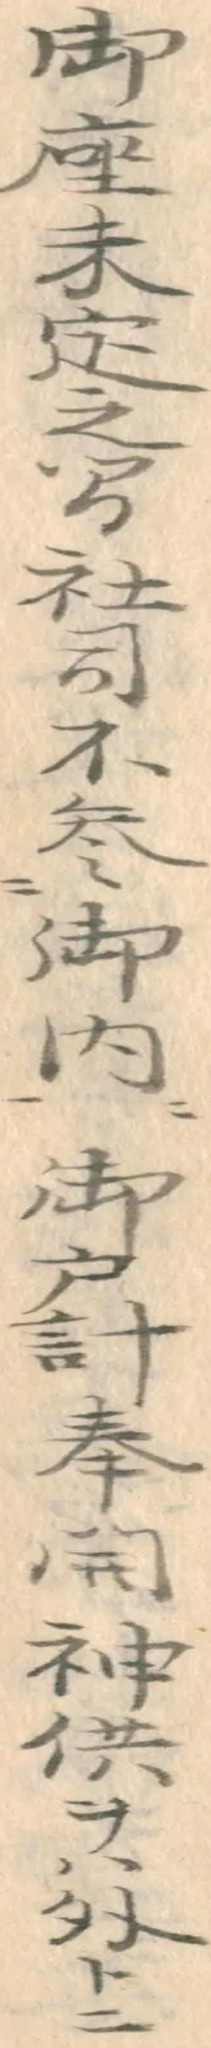御座未定之間社司不参御内御戸計奉開神供ヲハ外トニ
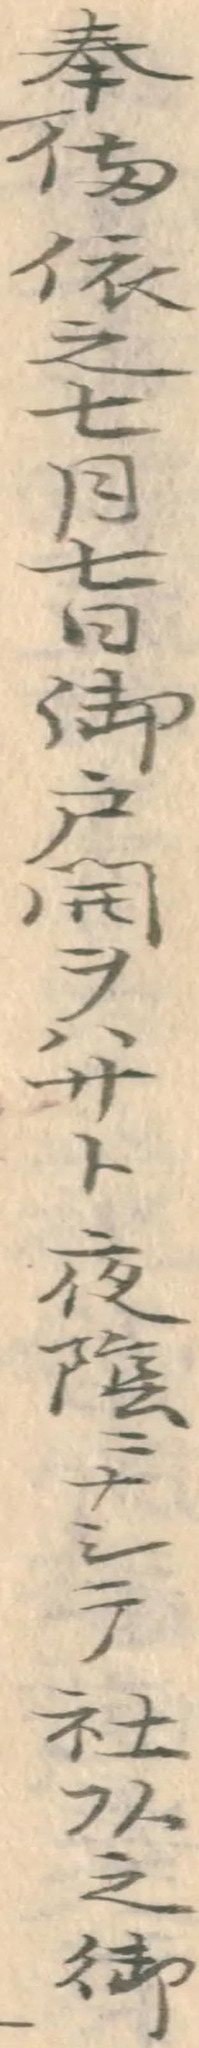奉備依之七月七日御戸開ヲハサト夜陰ニナシテ社頭之御
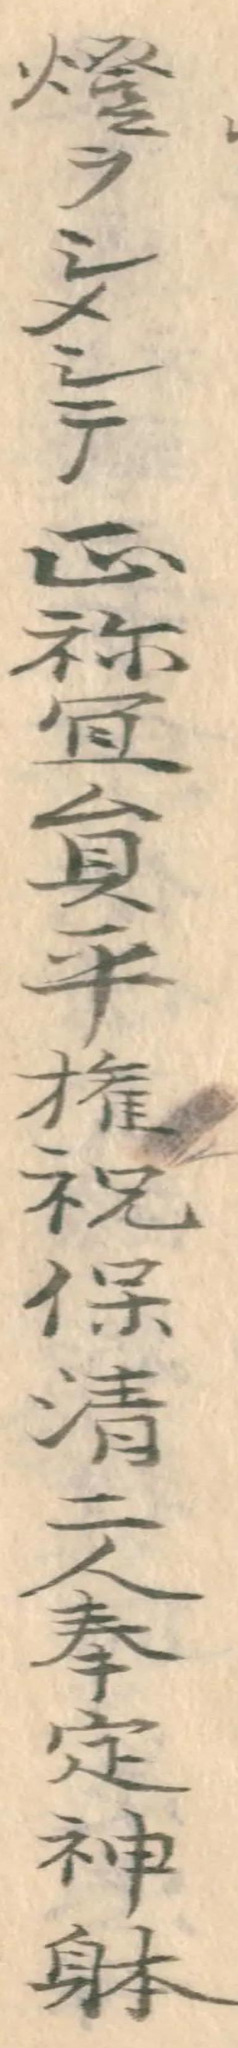燈ヲシメシテ正祢宜員平権祝保清二人奉定神体
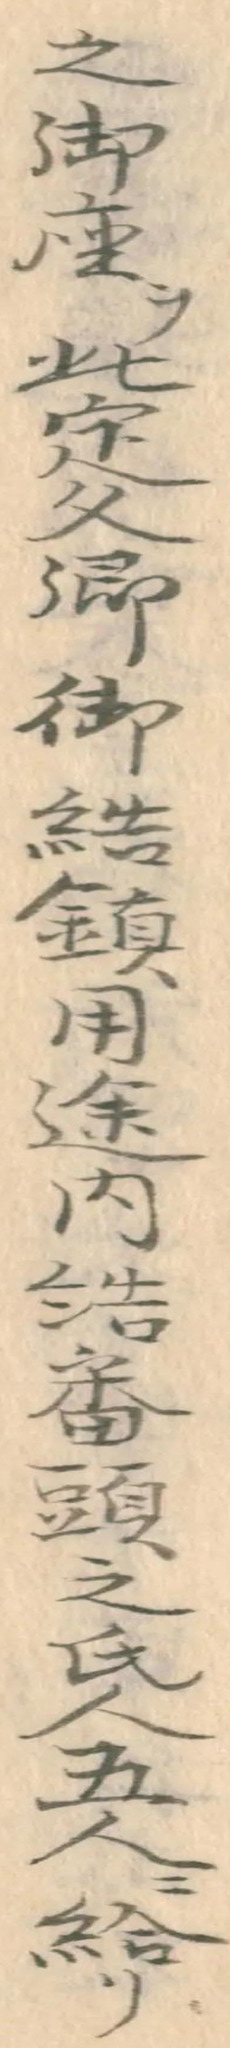之御座ヲ此定久卿御結鎮用途内結番頭之氏人五人ニ給リ
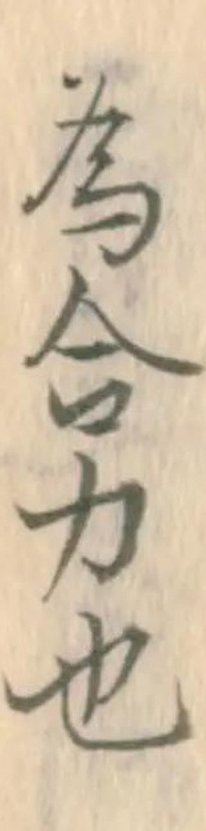為合力也
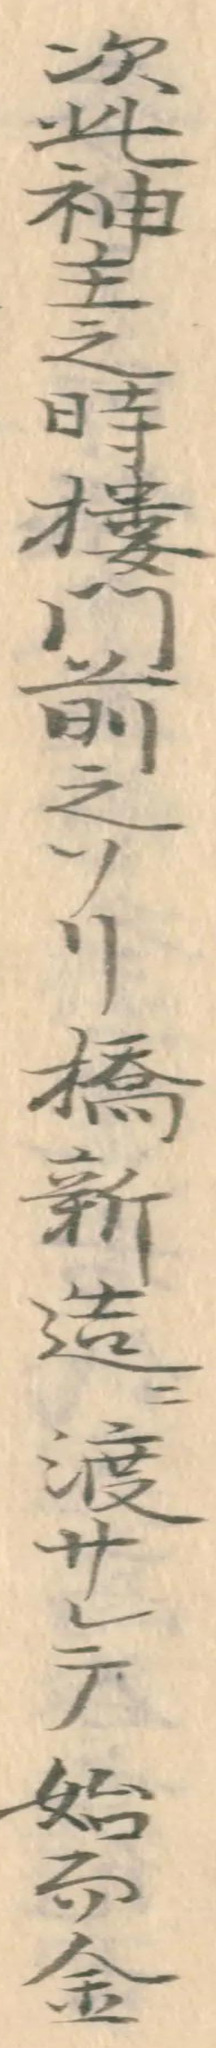次此神主之時楼門前之ソリ橋新造ニ渡サレテ始而金
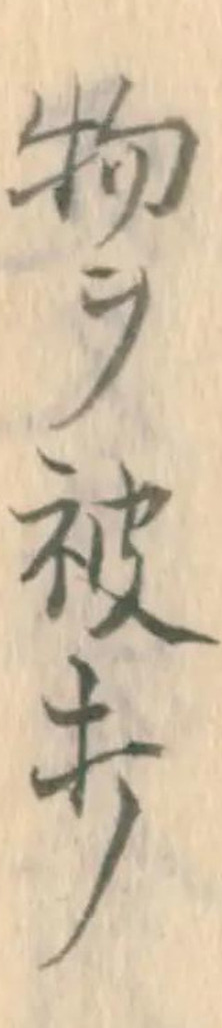物ヲ被打
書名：賀茂社記録. 第24冊
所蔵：国立国会図書館 National Diet Library, JAPAN
